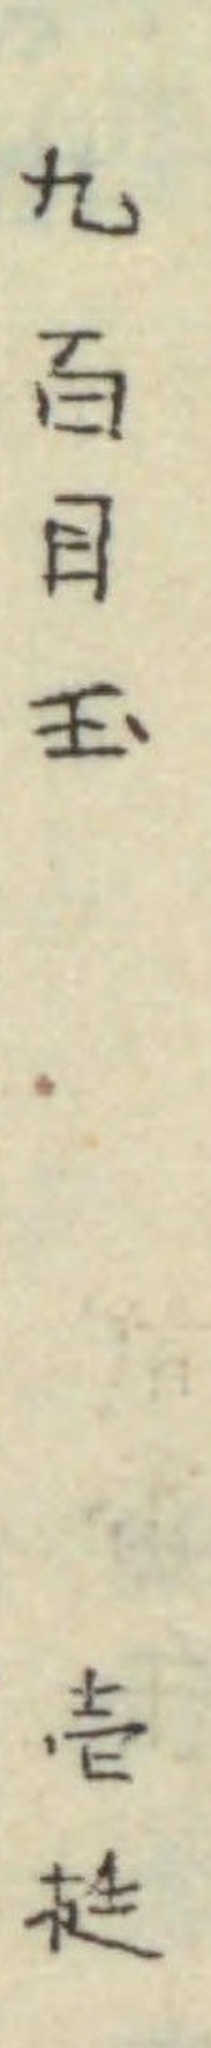九百目玉壱挺
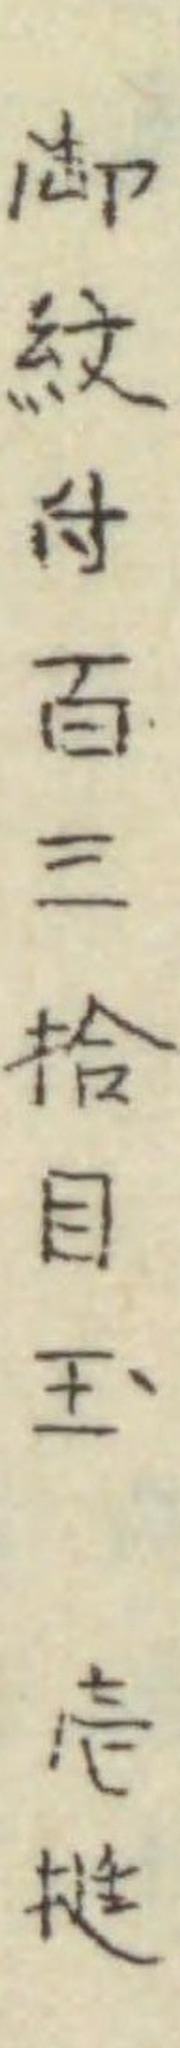御紋付百三拾目玉壱挺
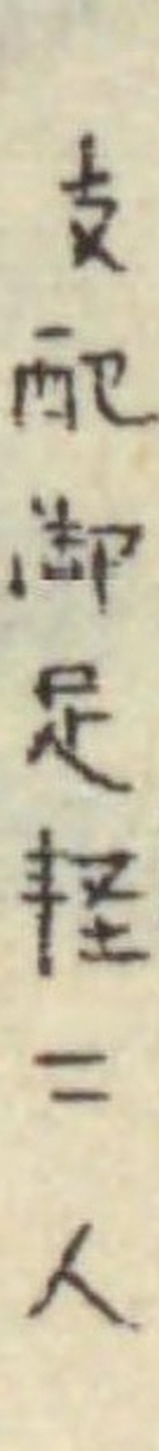支配御足軽二人
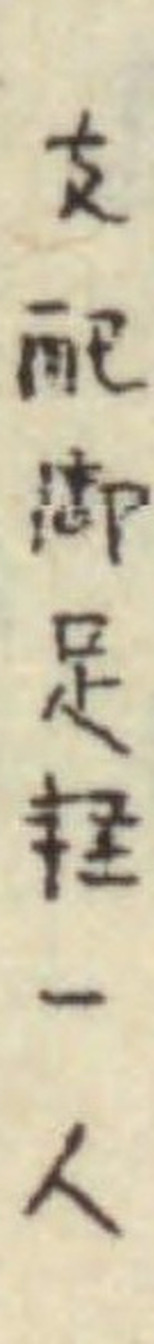支配御足軽一人
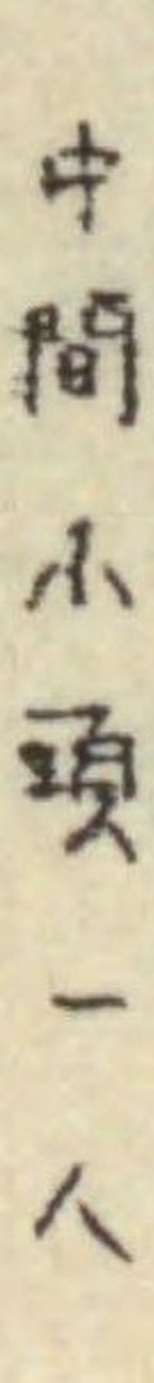中間小頭一人
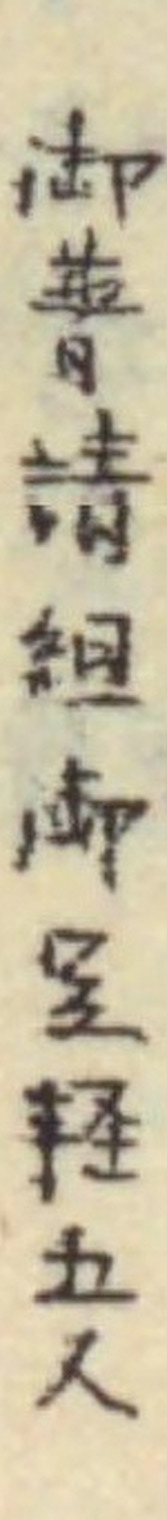御普請組御足軽五人
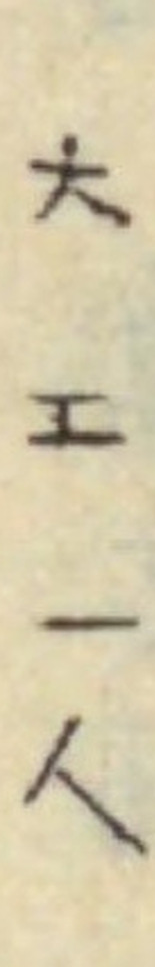大工一人
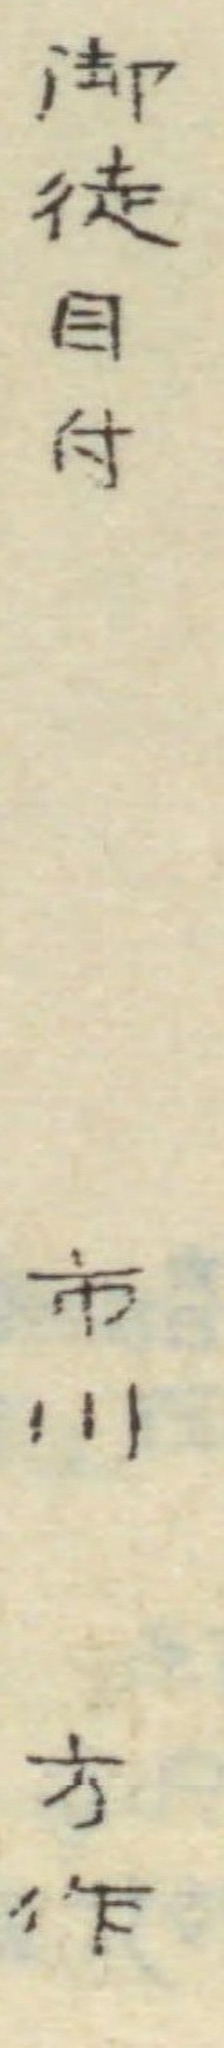御後目付市川方作
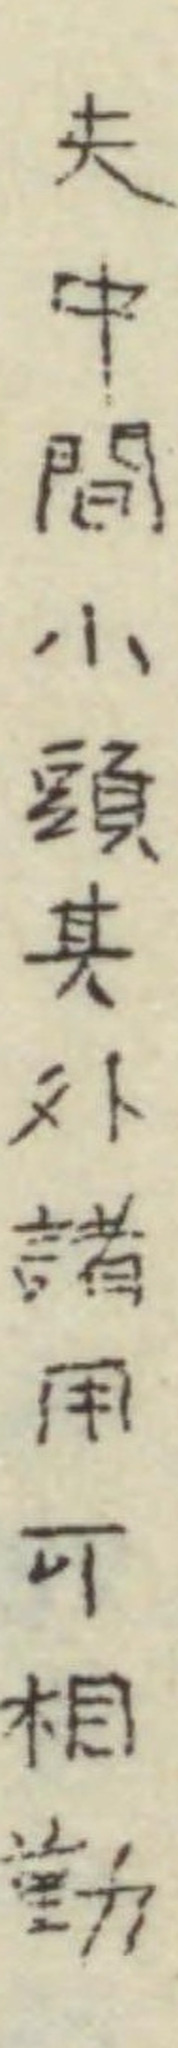夫中間小頭其外諸用可相勤庄屋
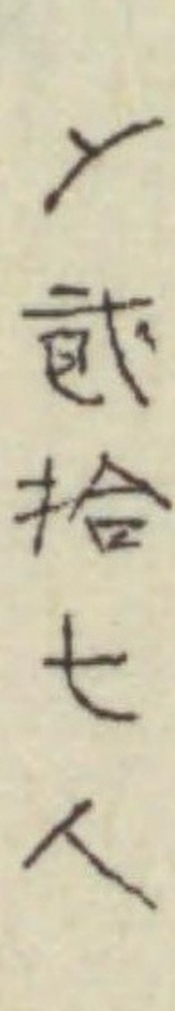〆弐拾七人
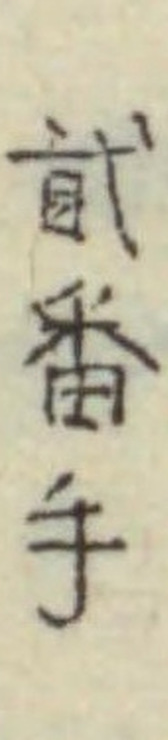弐番手
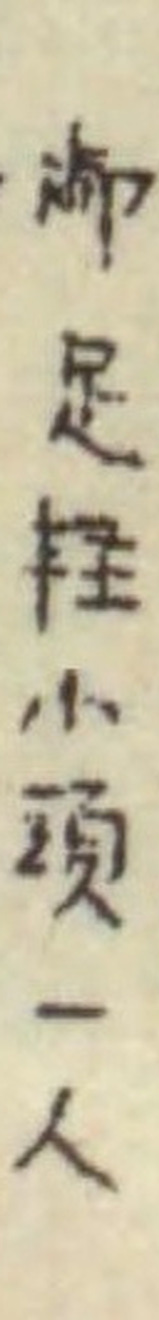御足軽小頭一人
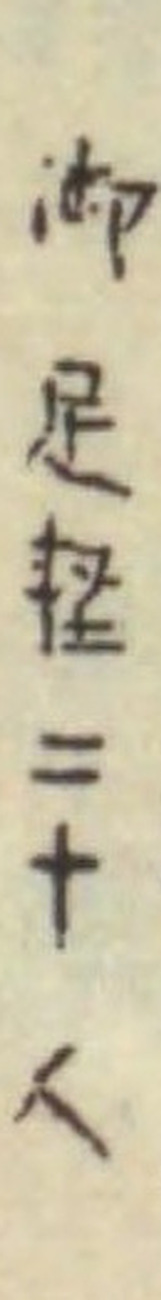御足軽二十人

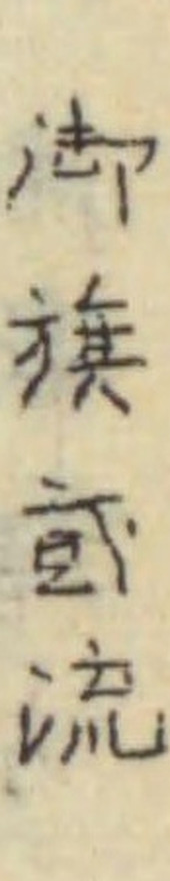御旗弐流
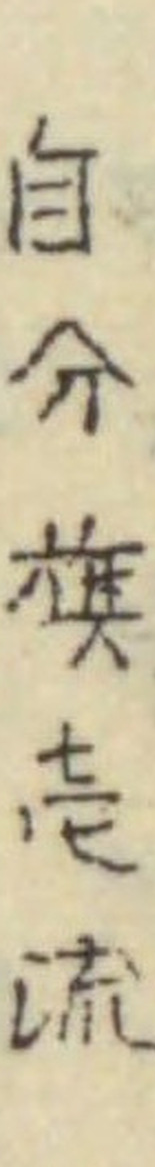自分旗壱流
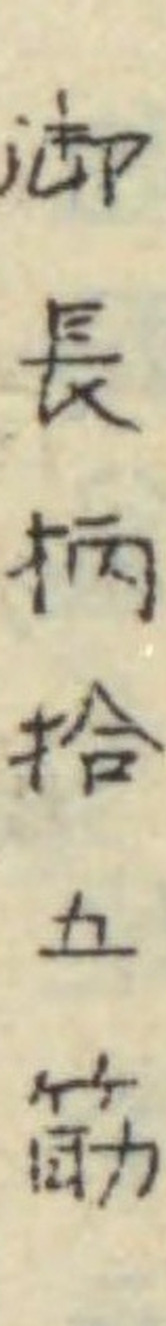御長柄拾五筋
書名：三河吉田藩動員史料
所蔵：国立国会図書館 National Diet Library, JAPAN
